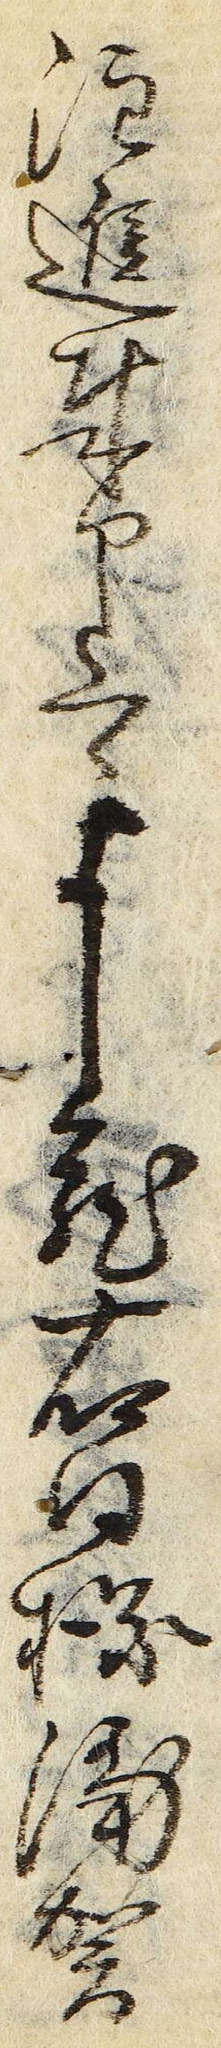注進奉申上候よし蔵右同様浦賀
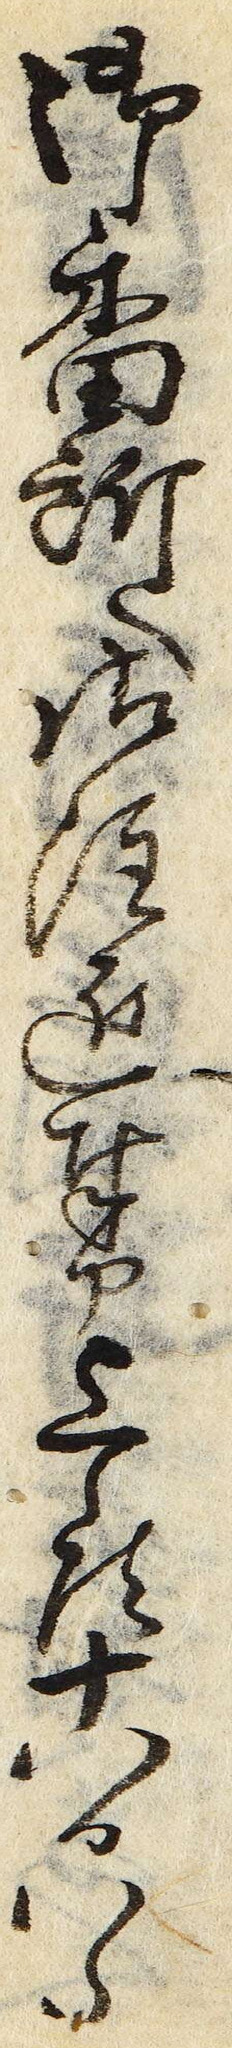御番所へ御注進奉申上候十八日八ツ
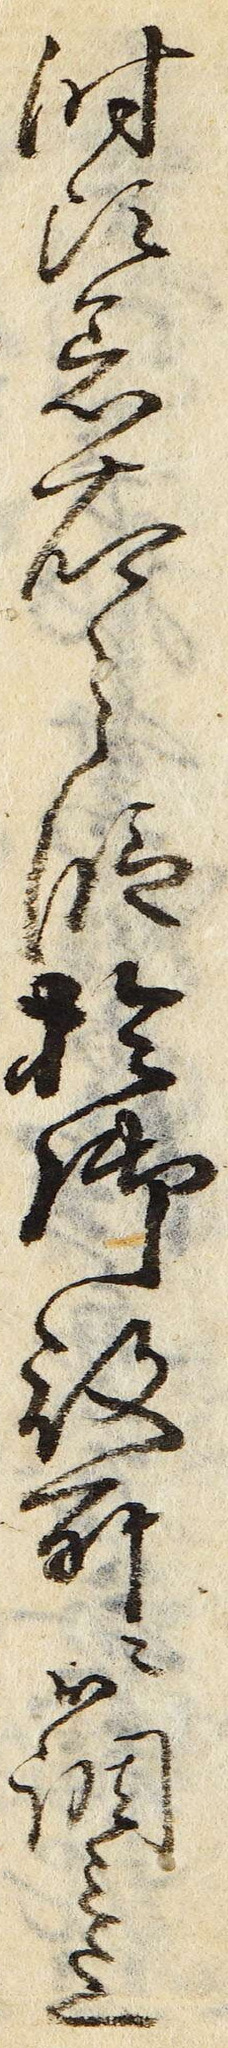時頃着右之段於御役所ニ御調之上
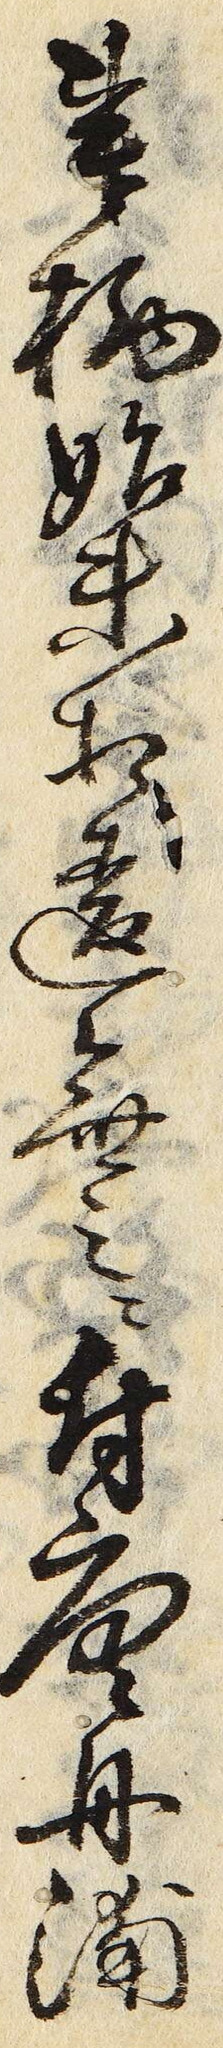事柄始末相違無之ニ付唐舟浦
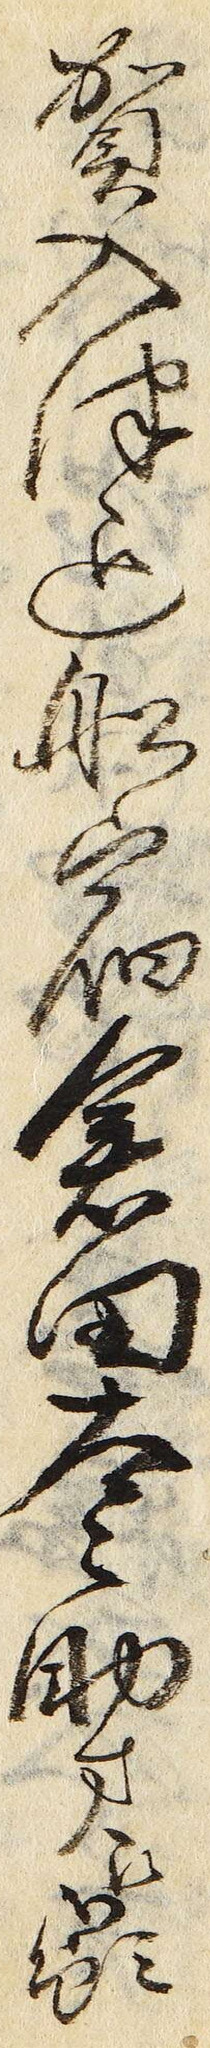賀入津迄船宿倉田太助方え御預
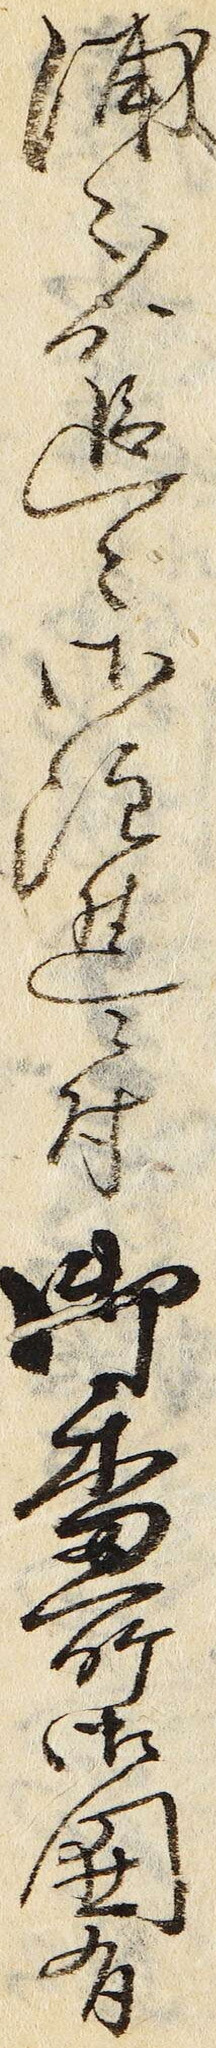浦々ゟ追々御注進ニ付御番所御囲有
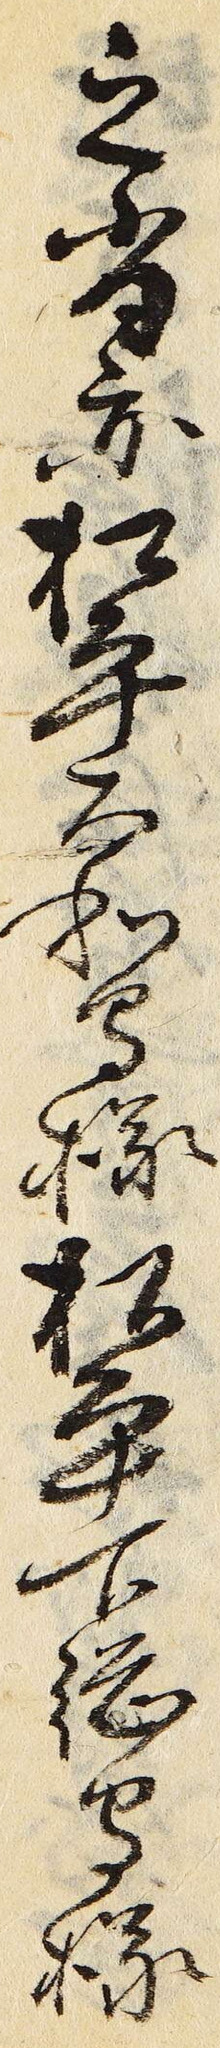之尚亦松平大和守様松平下総守様
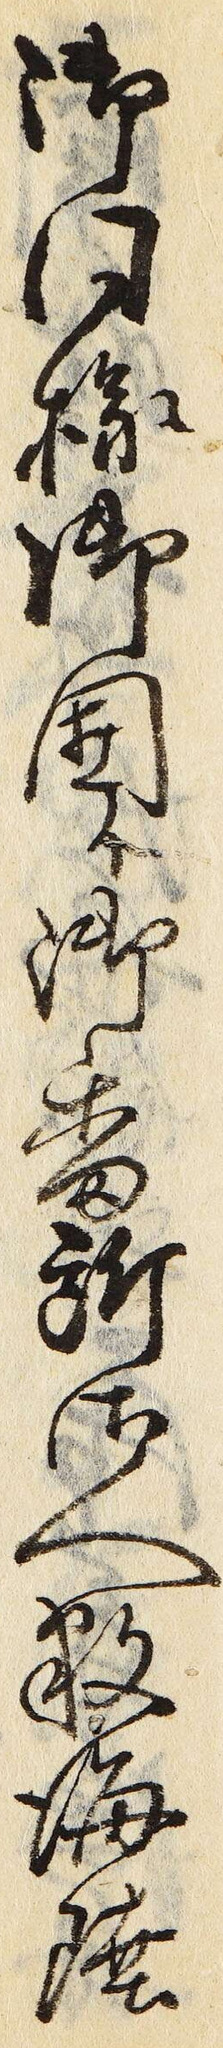御同様御囲イ御番所御人数海陸
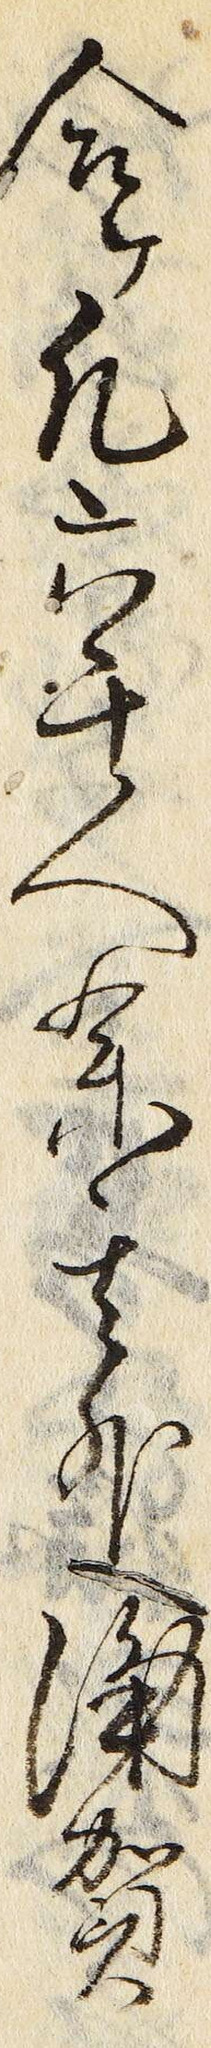合ケ凡六千人余其外浦賀
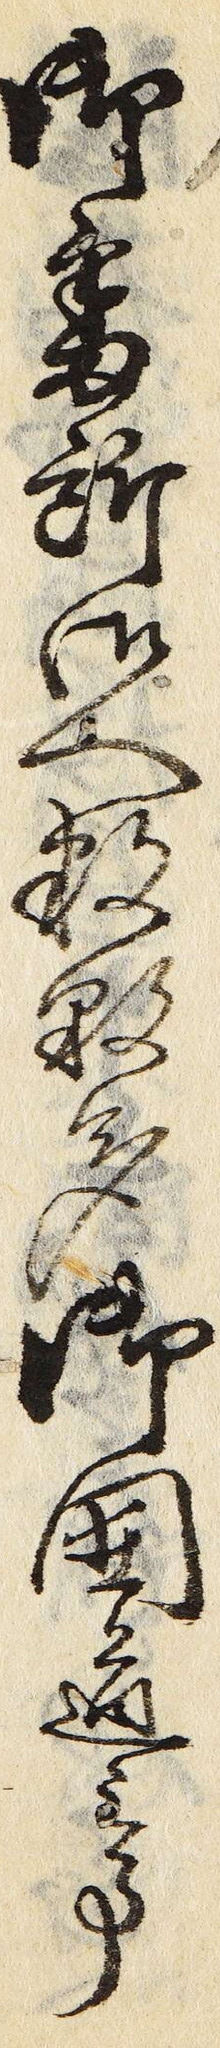御番所御人数数多御囲道之事
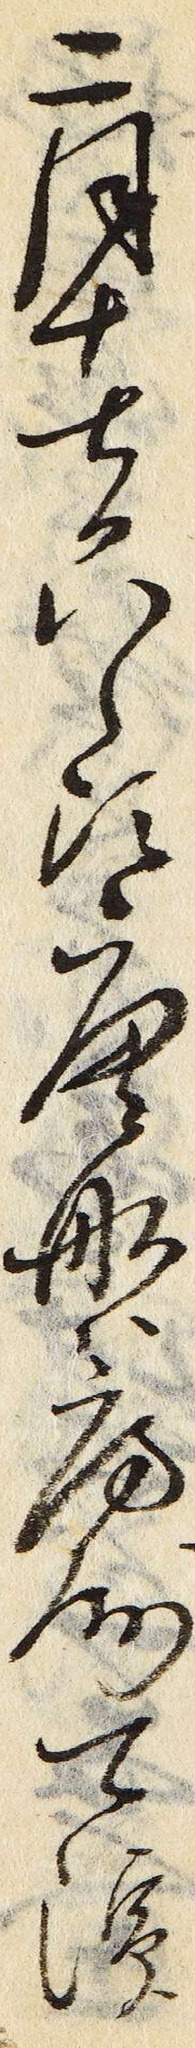二月十七日八ツ頃唐船ハ房州乙浜
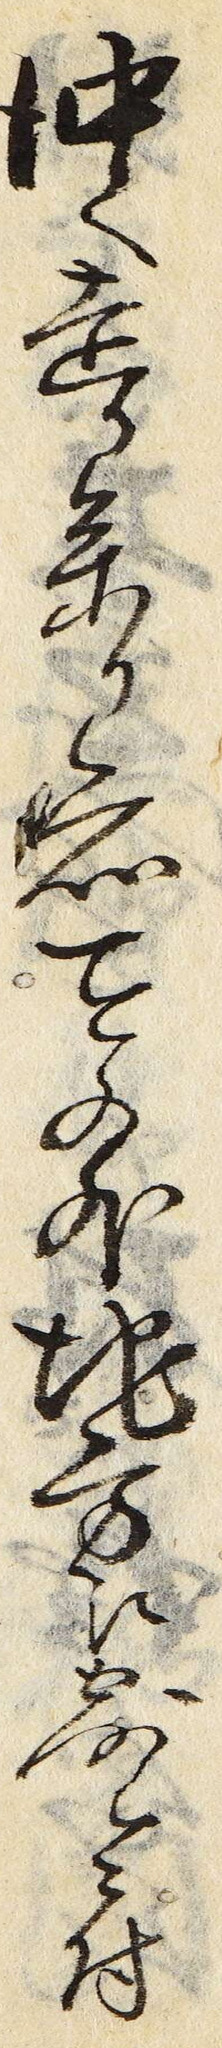沖へ走り参り候所ことの外地方え寄候ニ付
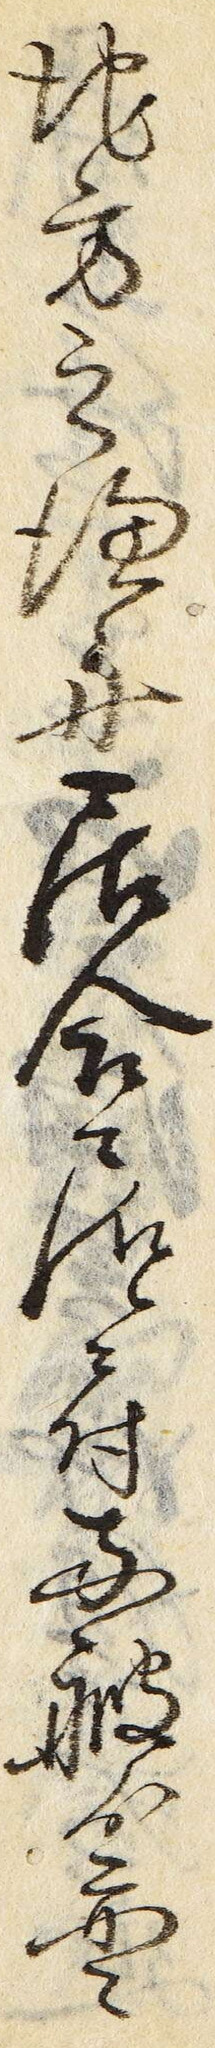地方之漁舟居合居候ニ付両艘ゟ亦々
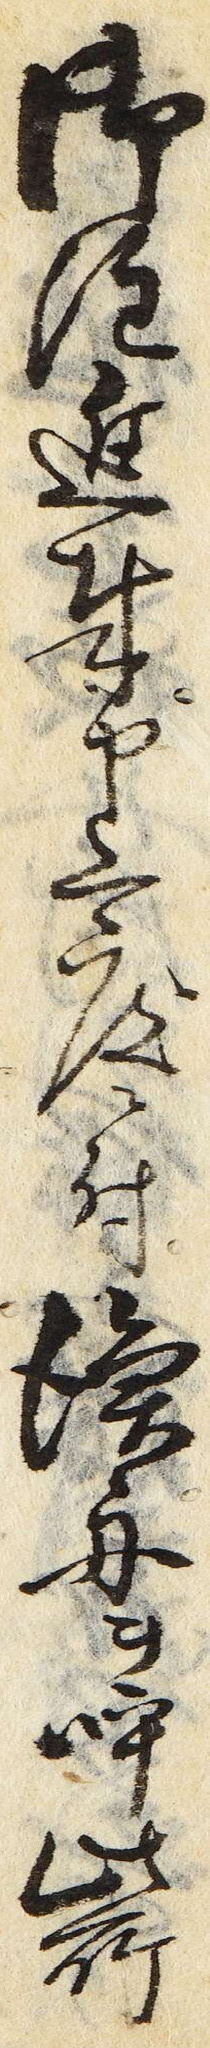御注進奉申上度ニ付漁舟ヲ呼此所
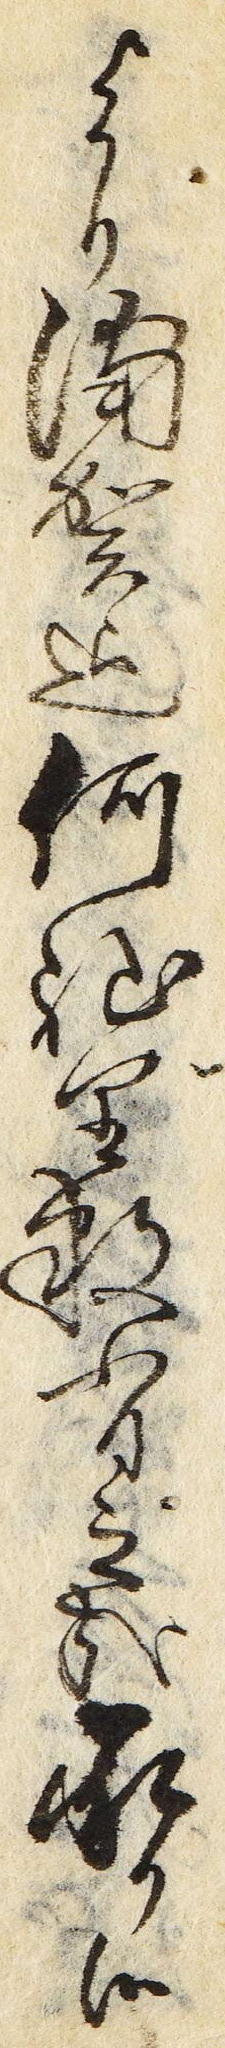より浦賀迄何程里数有之哉承り候
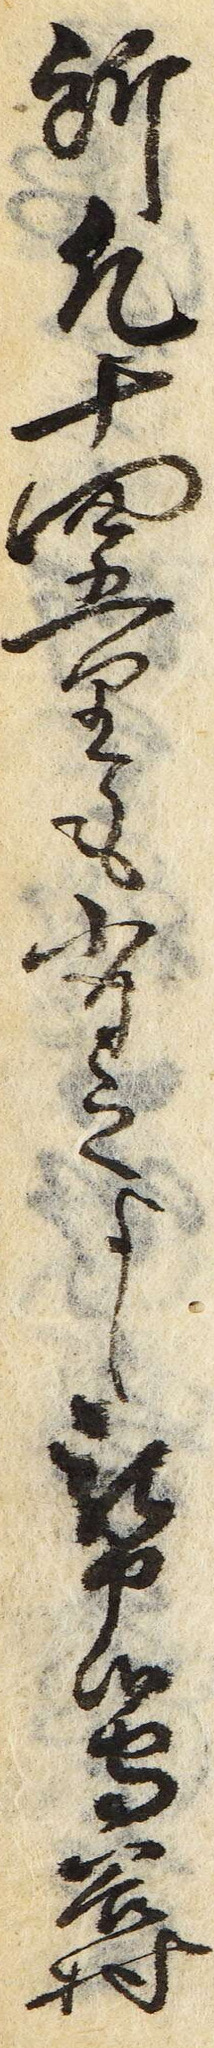所凡十四五里も有之よし被申候守谷村
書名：阿波幸宝丸漂流記
